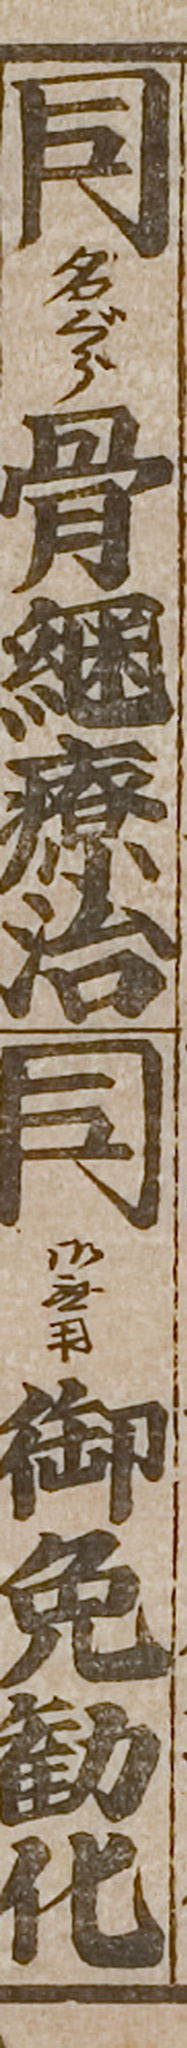同名ぐら骨継療治
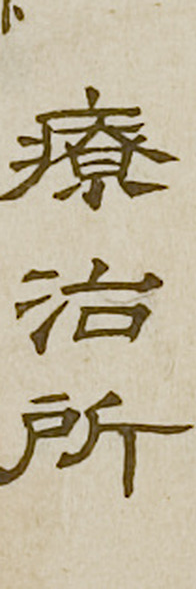療治所
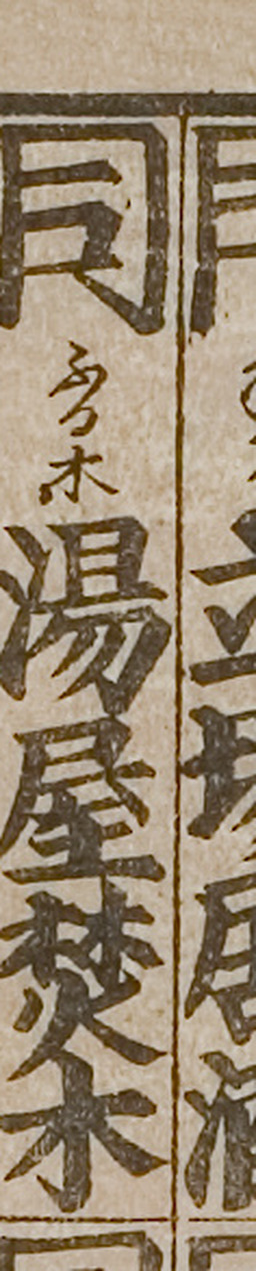同ふる木湯屋焚木
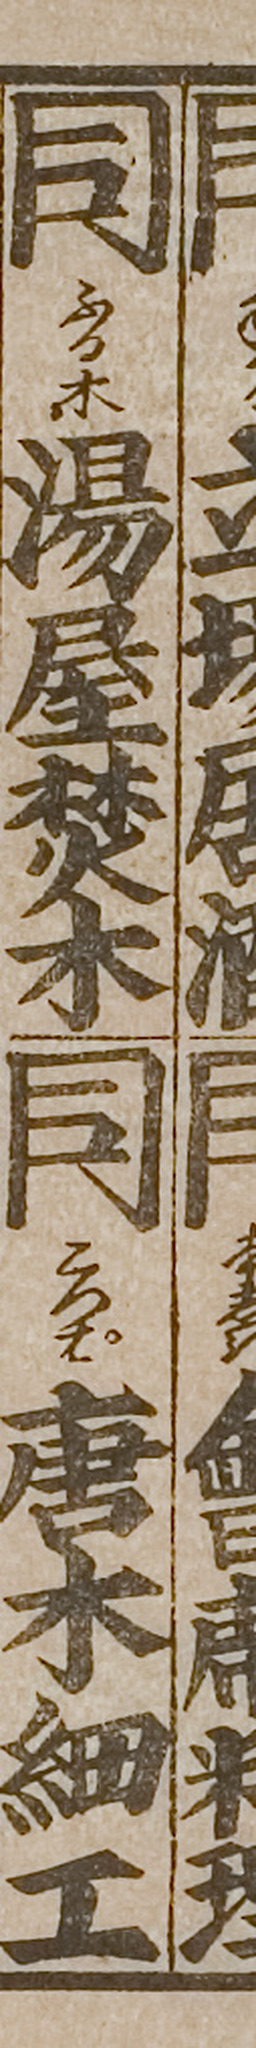同ふる木湯屋焚木
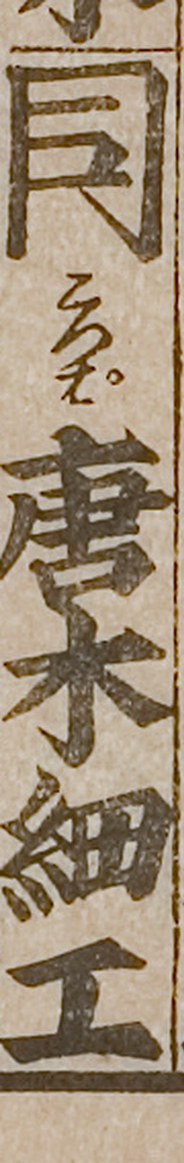同こつぱ唐木細工
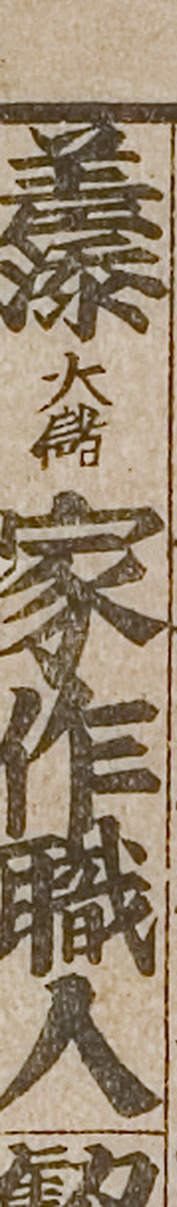差添大儲家作職人
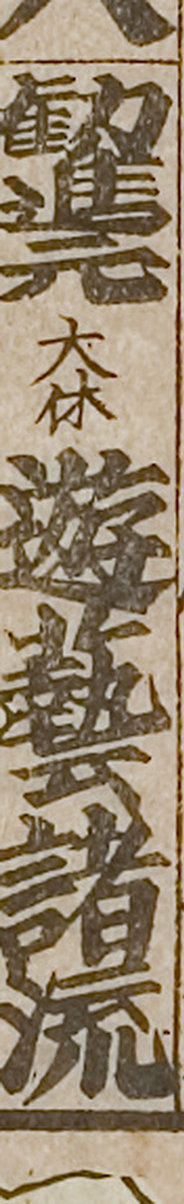勧進元大休遊芸諸流
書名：安政二年十月二日地震出火後日角力
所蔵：東京大学総合図書館 General Library in the University of Tokyo, JAPAN
